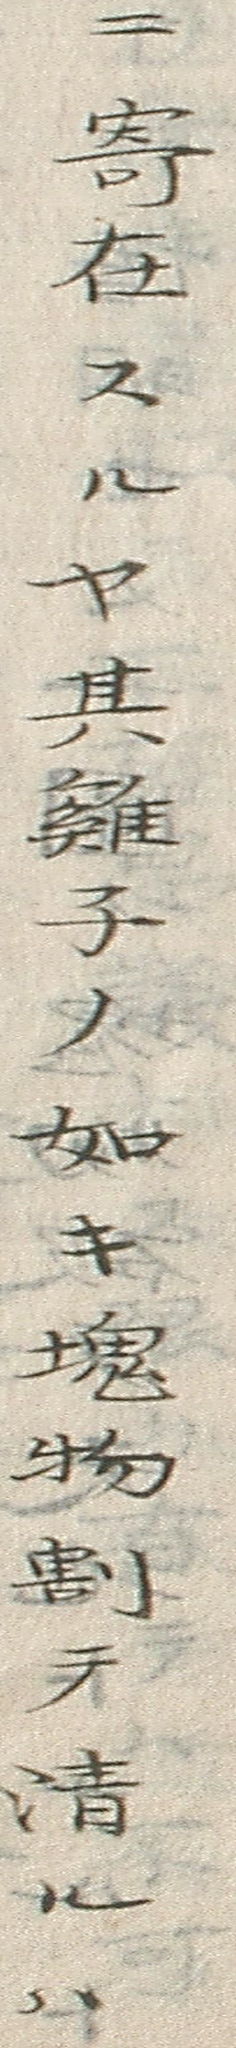ニ寄在スルヤ其雞子ノ如キ塊物割テ清ルハ
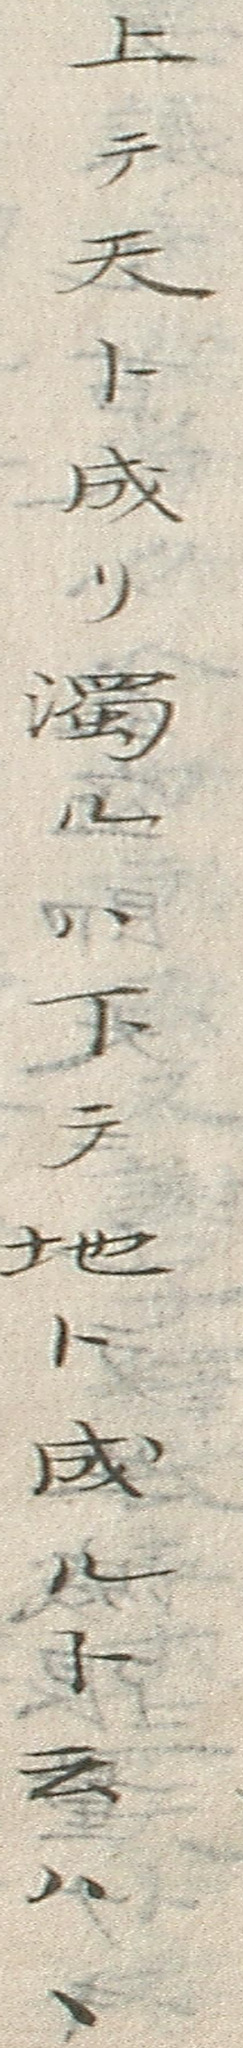上テ天ト成リ濁ルハ下テ地ト成ルト云ハヽ
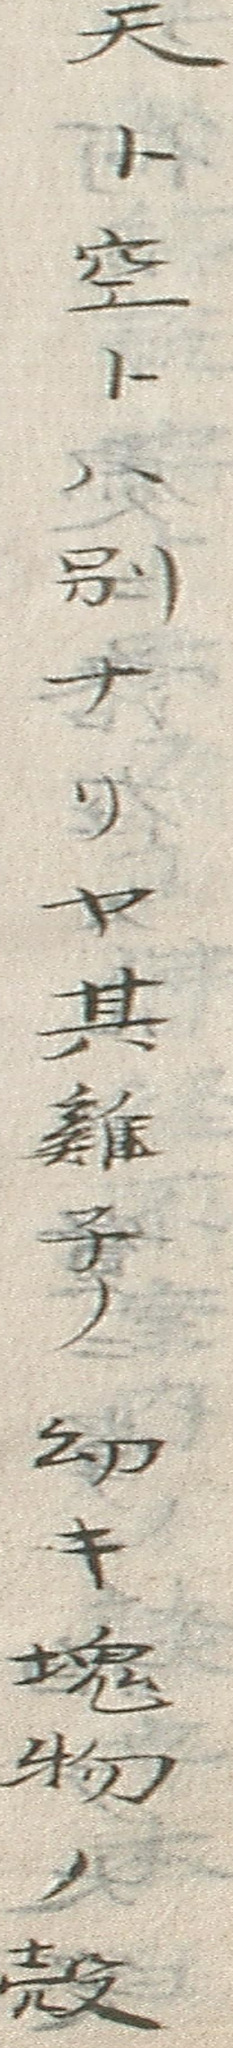天ト空トハ別ナリヤ其雞子ノ幼キ塊物ノ殻

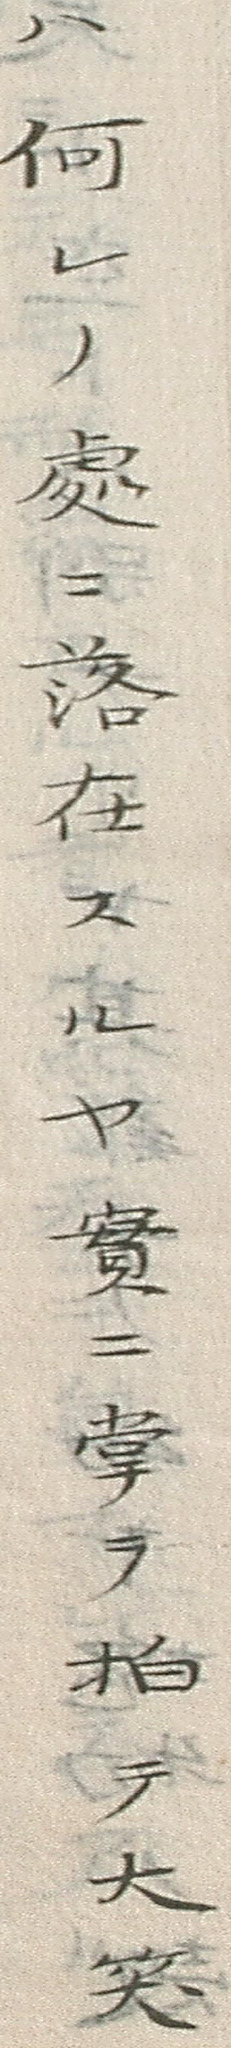ハ何レノ処ニ落在スルヤ実ニ掌ヲ拍テ大笑
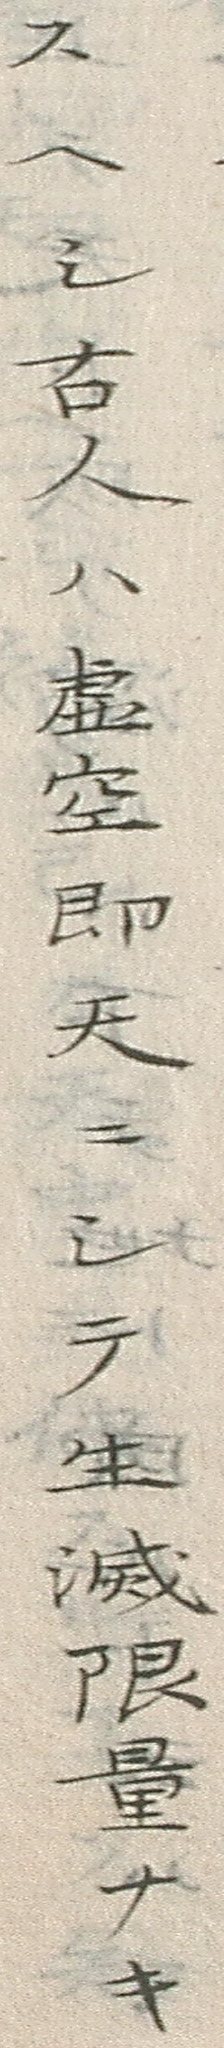スヘシ古人ハ虚空即天ニシテ生滅限量ナキ
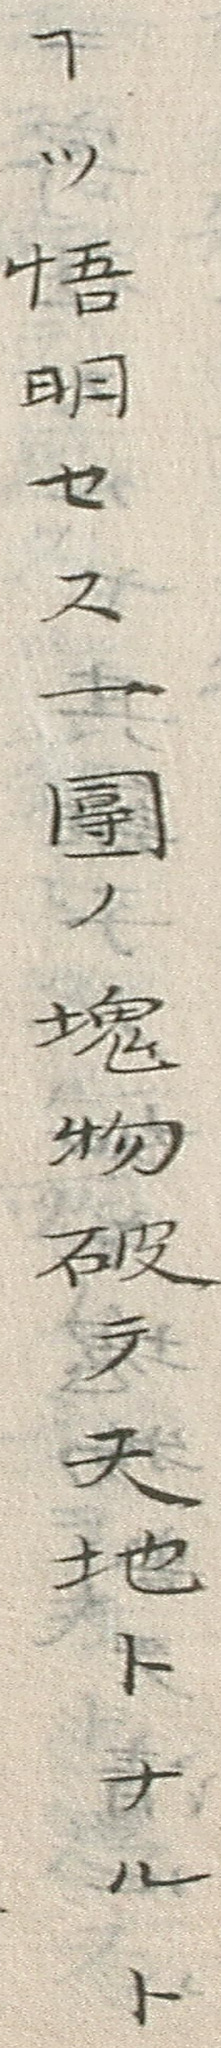コトツ悟明セス一団ノ塊物破テ天地トナルト
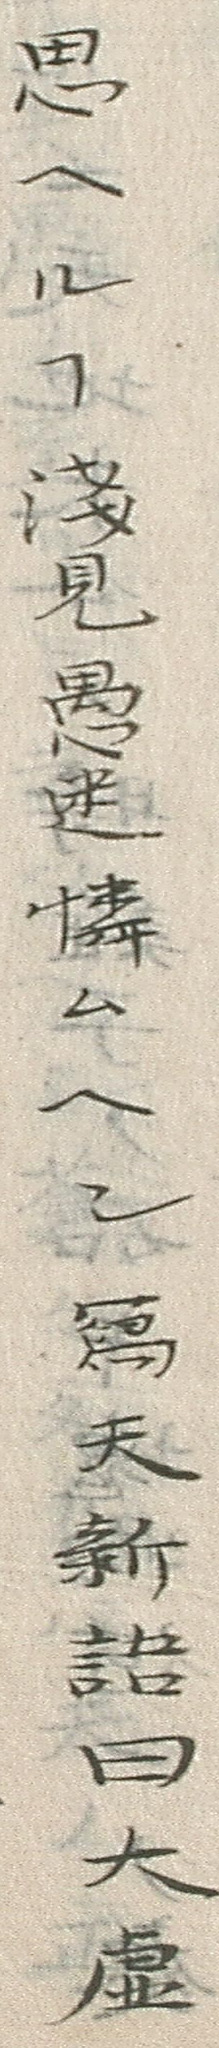思ヘルコト浅見愚迷憐ムヘシ写天新語曰大虚
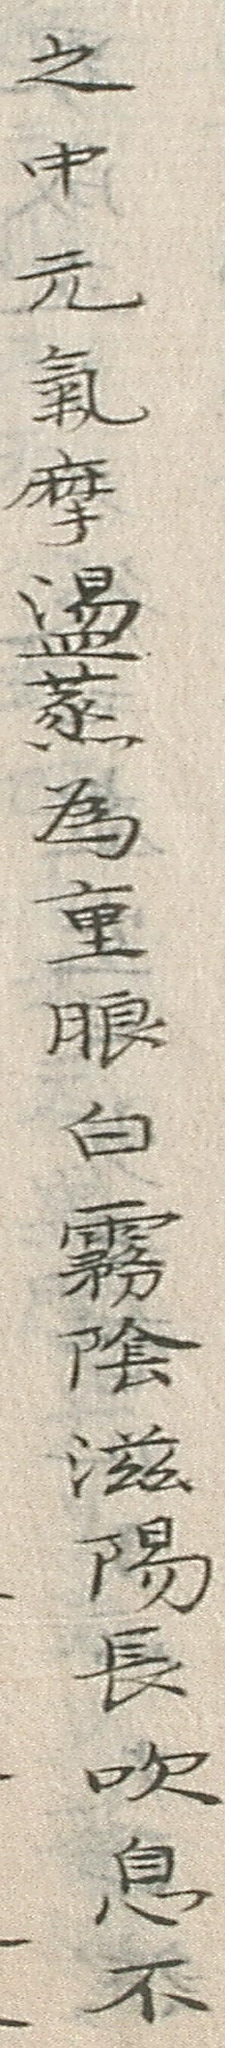之中元気摩盪蒸為重朖白霧陰滋陽長吹息不
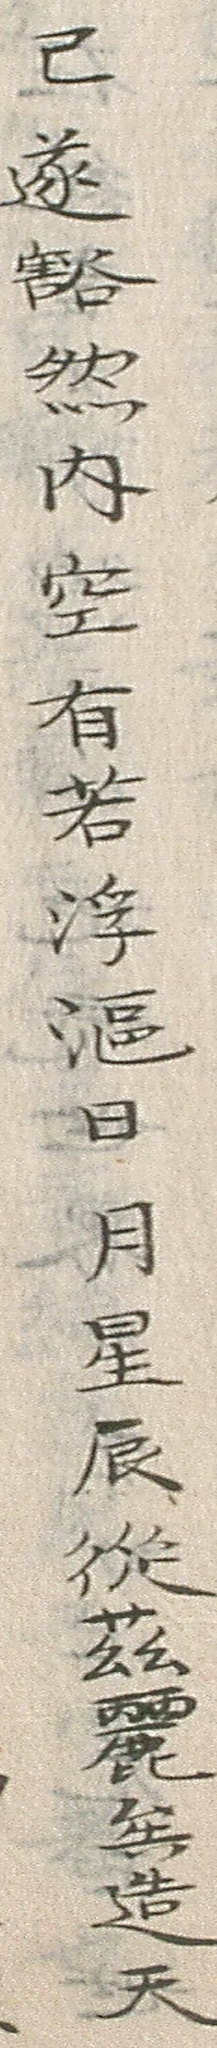己遂豁然内空有若浮漚日月星辰従茲麗矣造天
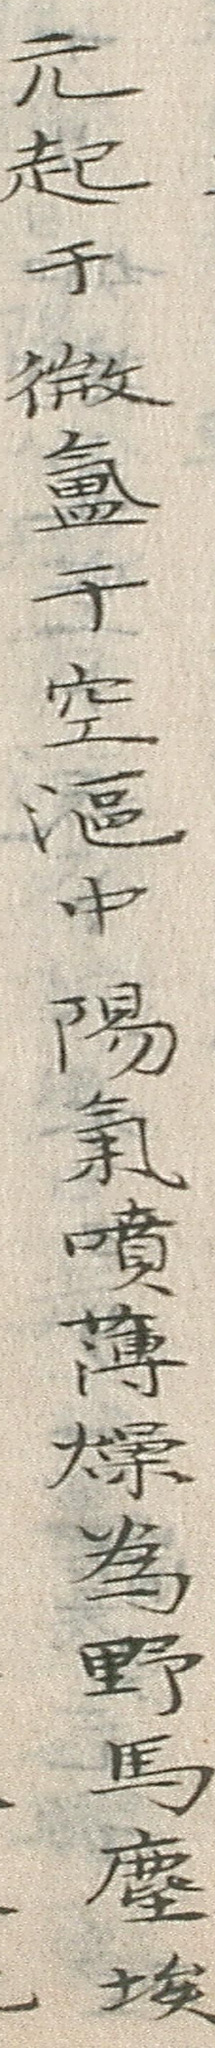元起于微氳于空漚中陽気噴薄燥為野馬塵埃
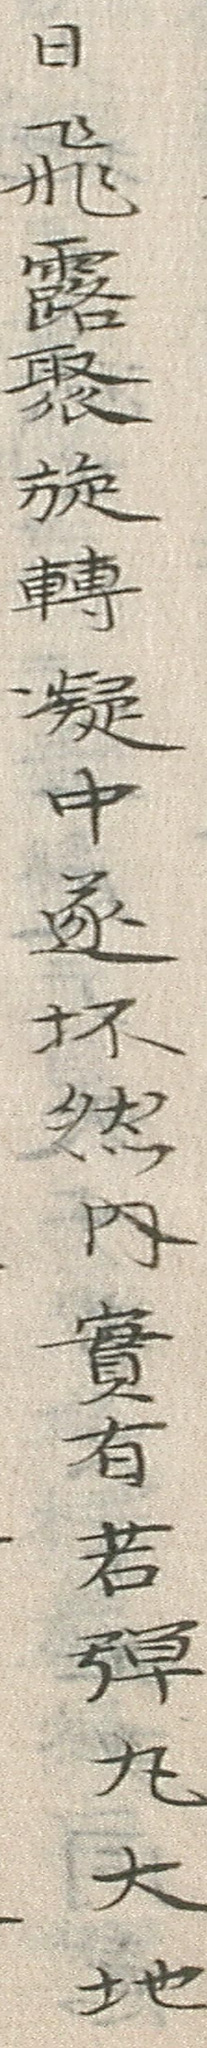日飛露聚旋転凝中遂坏然内実有若弾丸大地
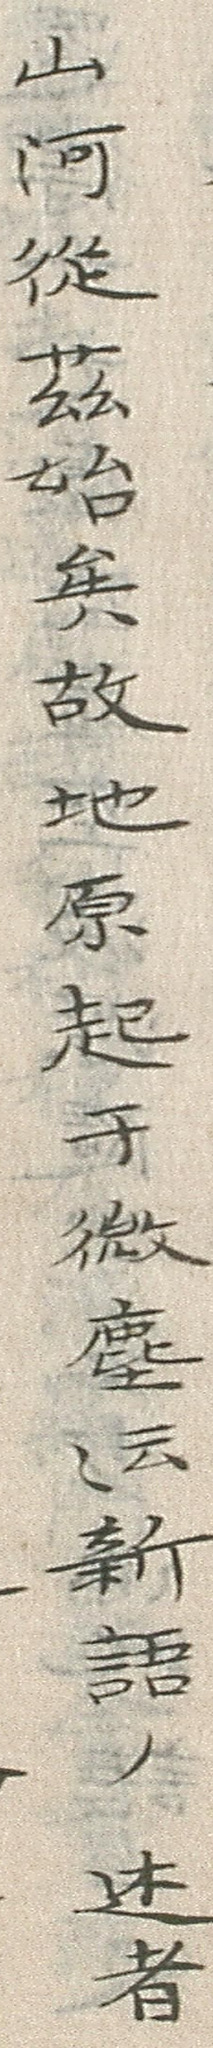山河従茲始矣故地原起于微塵云〻新語ノ述者
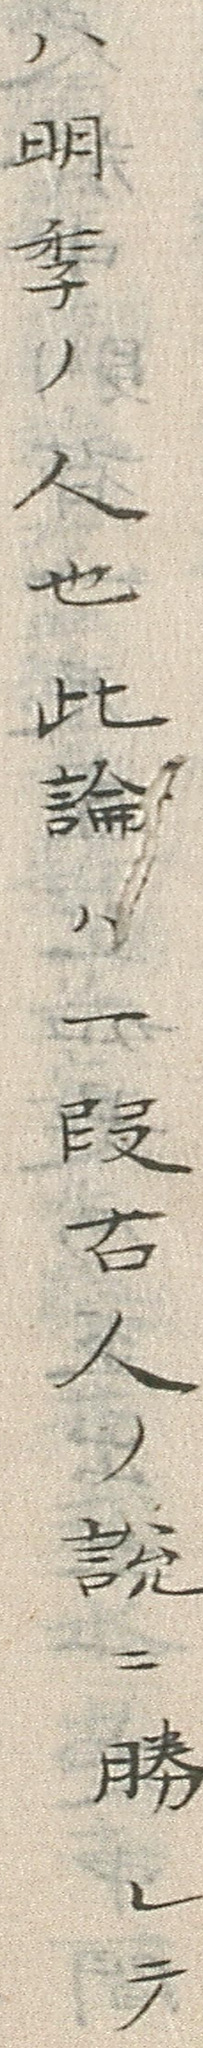ハ明季ノ人也此論ハ一叚古人ノ説ニ勝レテ
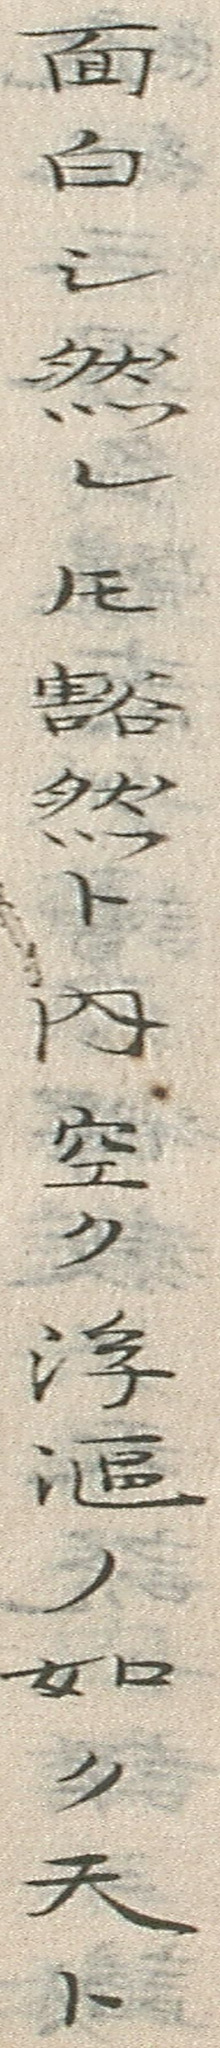面白シ然レトモ豁然ト内空ク浮漚ノ如ク天ト
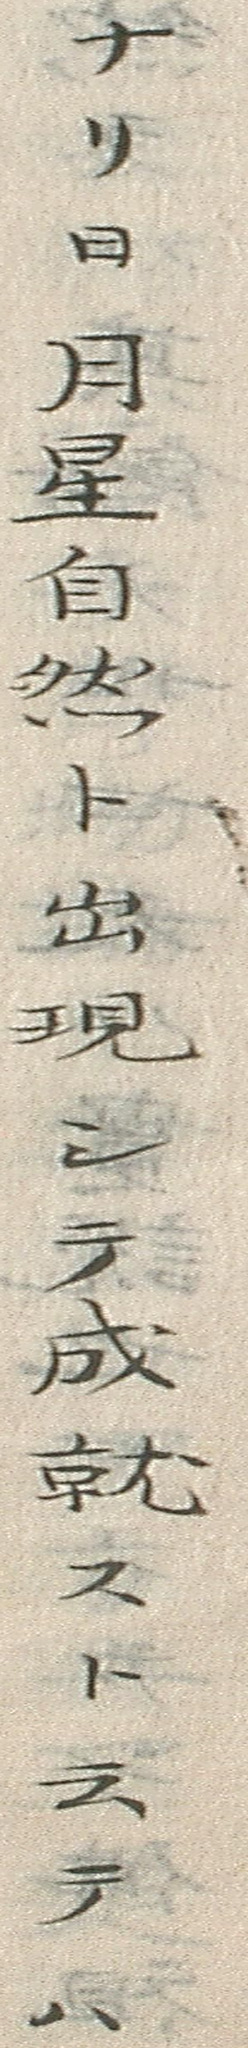ナリ日月星自然ト出現シテ成就スト云テハ
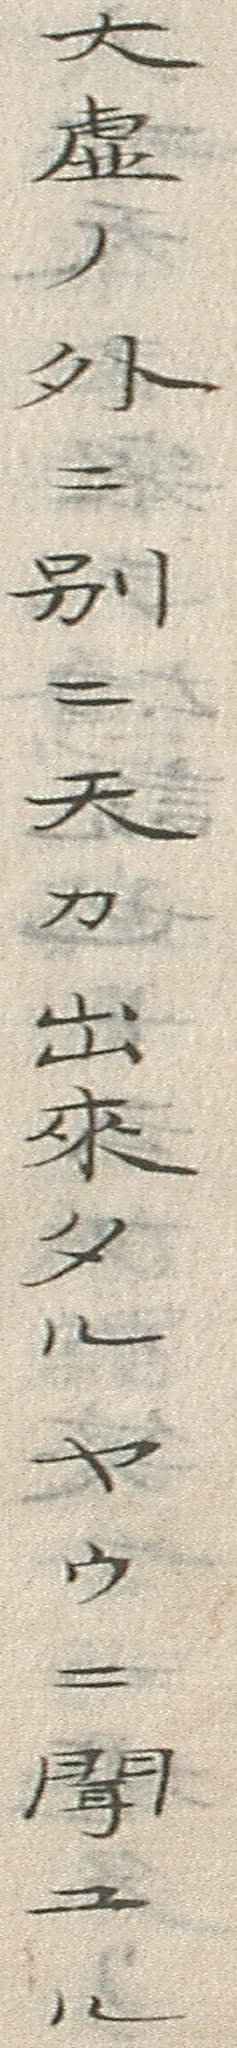大虚ノ外ニ別ニ天カ出来タルヤウニ聞ユル
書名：天學略名目羽翼　全
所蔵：東京大学地震研究所図書室 Earthquake Research Institute Library, The University of Tokyo, JAPAN
